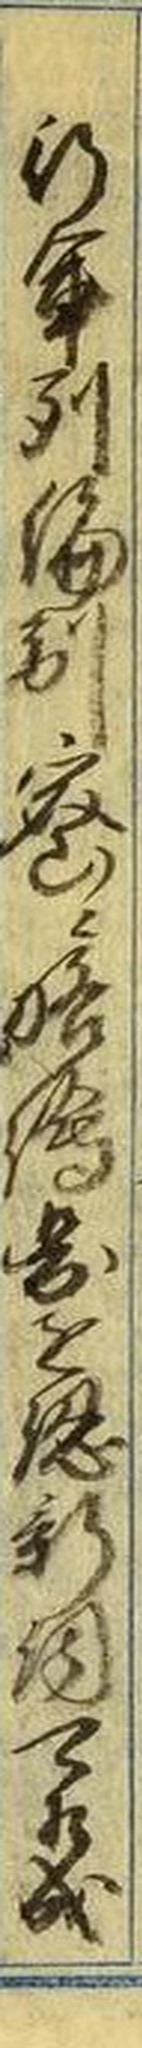行軍列編制密々略絵図を認新調可相成
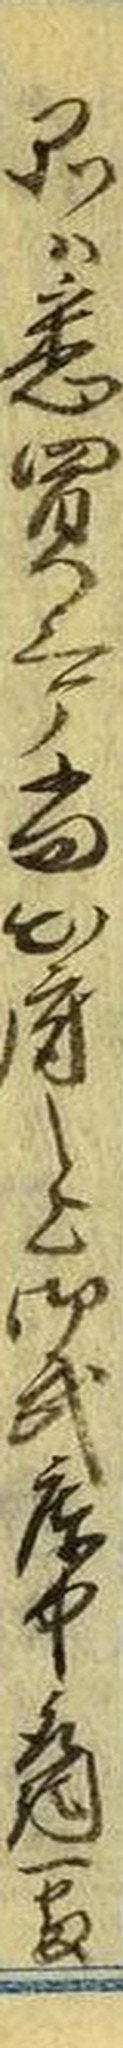品は悉買上ケ尚出府之上御武庫中取調一番
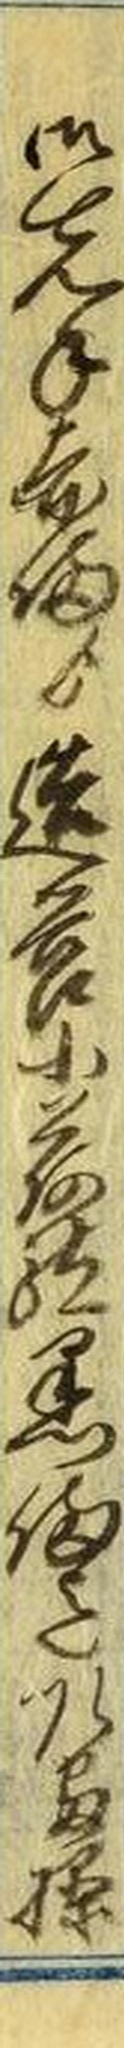御先手赤備ゟ造営小荷駄黒備迄順番操
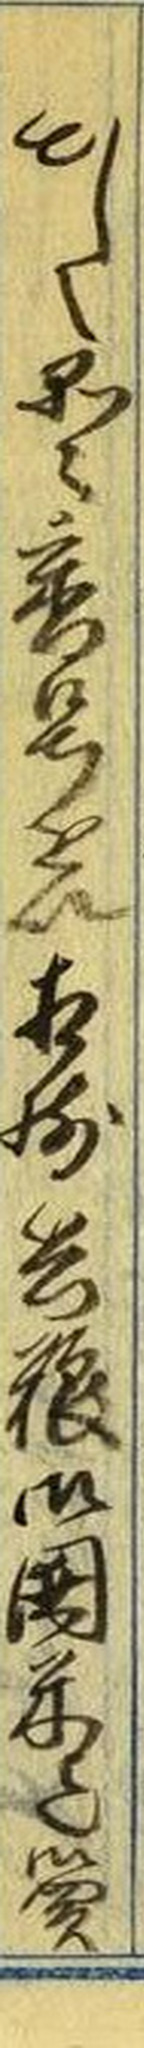出し之品々番号を以相揃兵粮御囲米迄御買
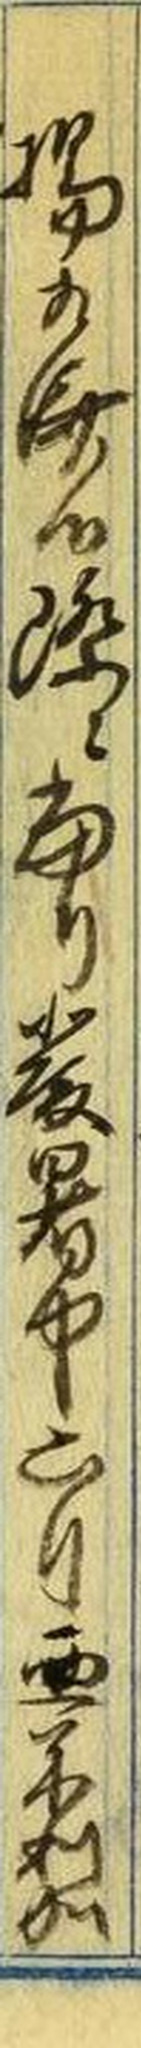揚相済候際に当り厳暑中六月亜米利加
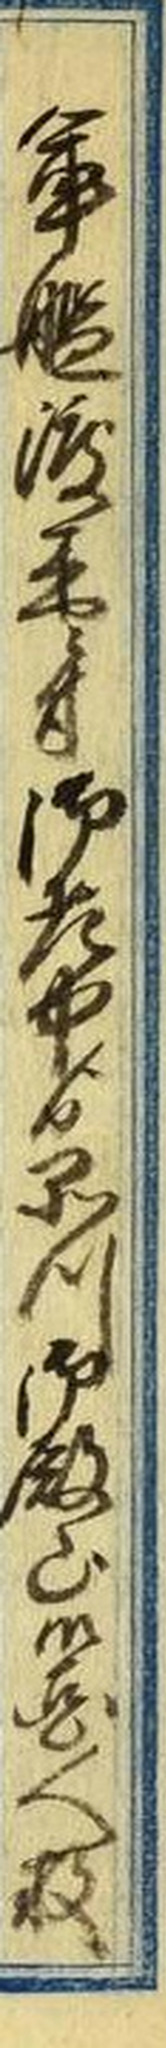軍艦渡来に付御老中ゟ品川御殿山御固人数
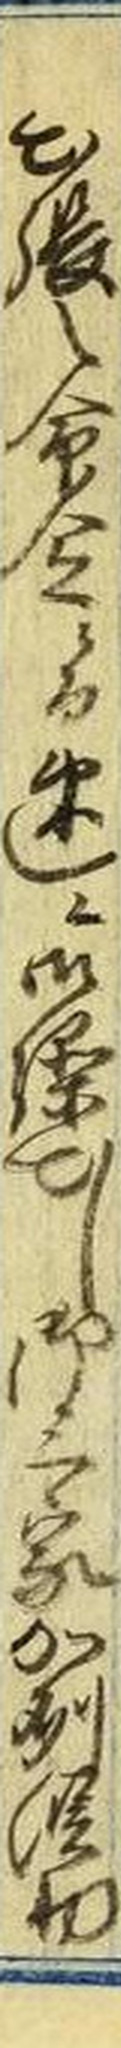出張之命令に而速に御繰出し御三家加州侯初
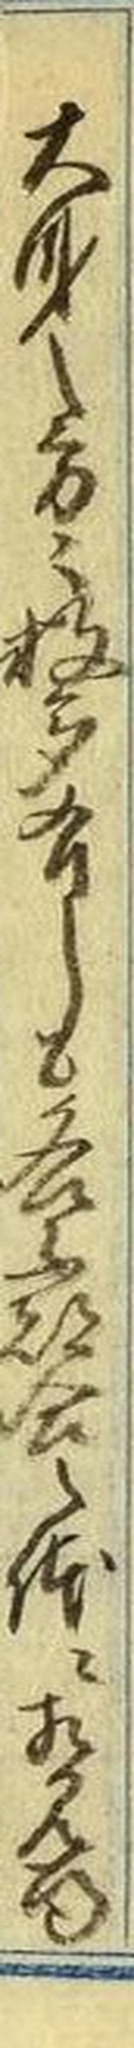大身之方々数多有しも各不都合之体に相見得
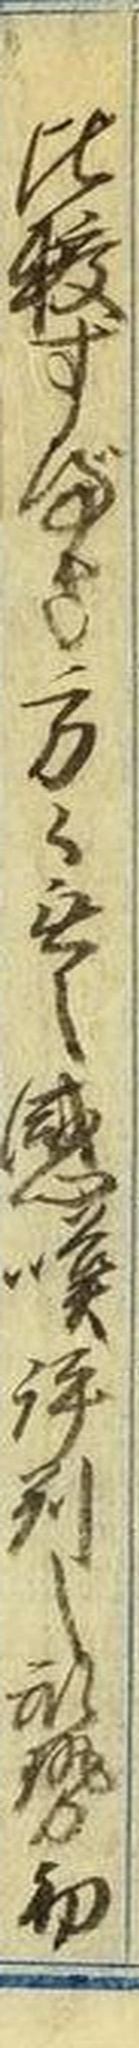比較すべき方々無之感嘆評判之形勢初
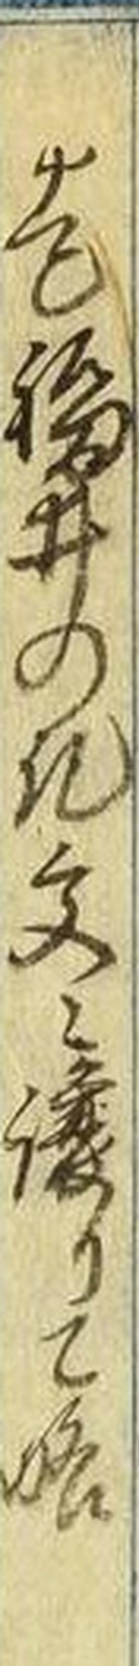巻福井の紀文に譲りて略
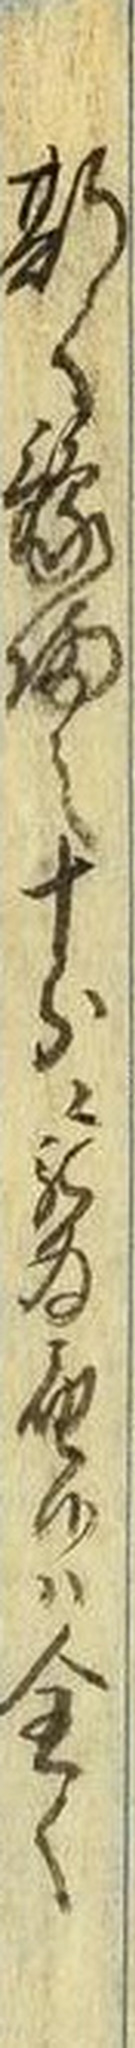斯く予備之十分に被為届候は全く
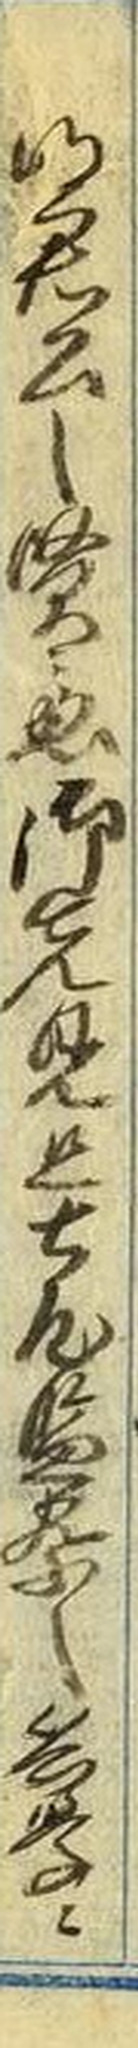名君公之賢慮御先見且土屋監察之兵学に
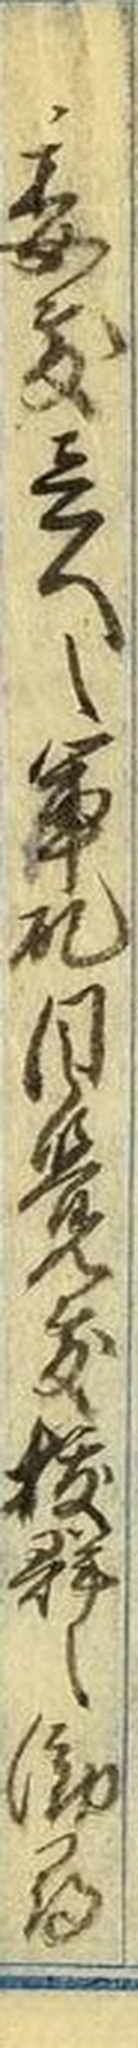委敷壱人之軍配目覚敷援群之働尋
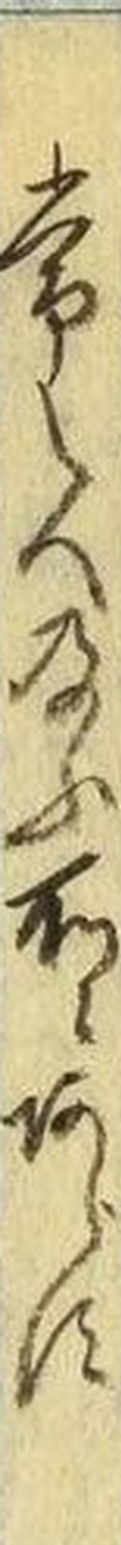常之人及ふ所にあらす
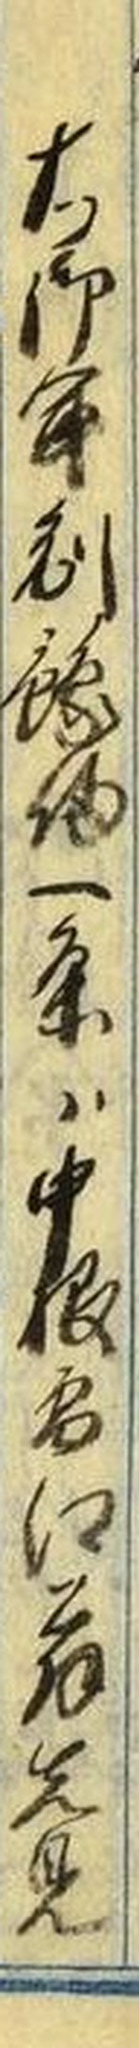右御軍制予備一条は中根雪江翁先見

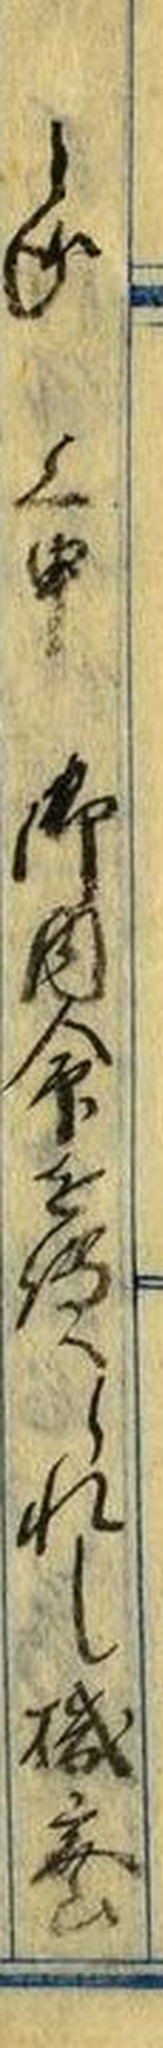之趣上申御内命を伝へられし機密
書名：温古集 四巻
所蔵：福井県文書館 Fukui Prefectural Archives
